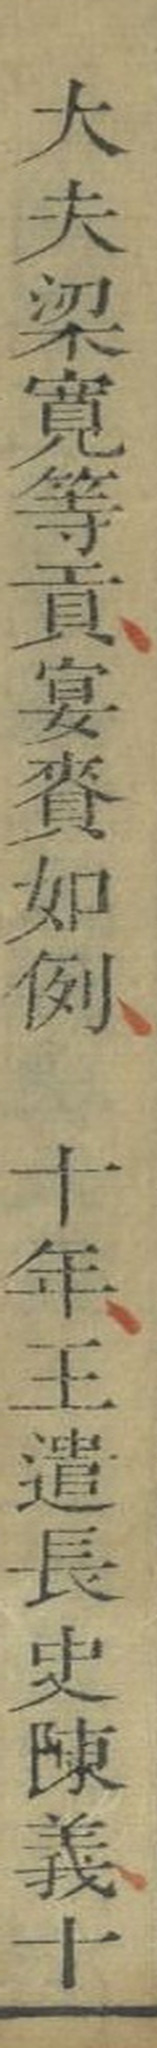大夫梁寛等貢宴賚如例十年王遣長史陳義十
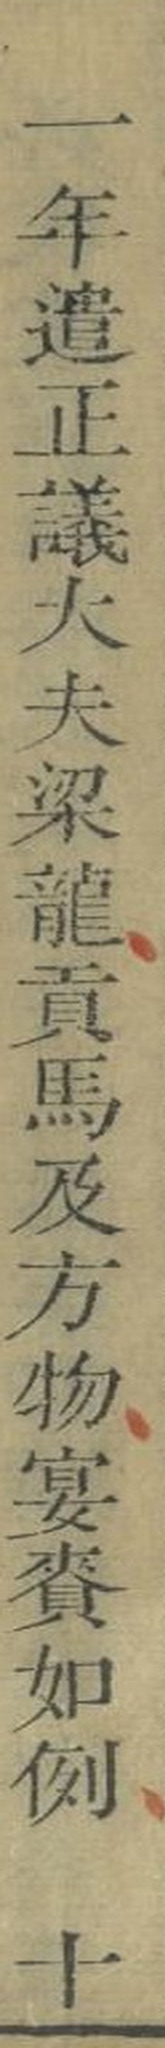一年遣正議大夫梁竜貢馬及方物宴賚如例十
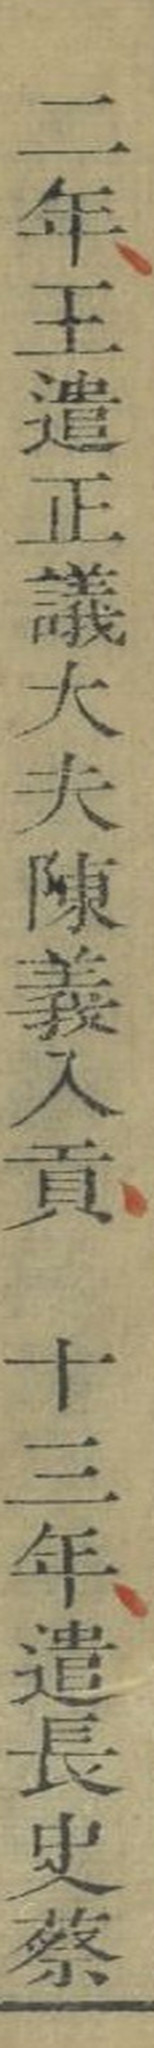二年王遣正議大夫陳義入貢十三年遣長史蔡
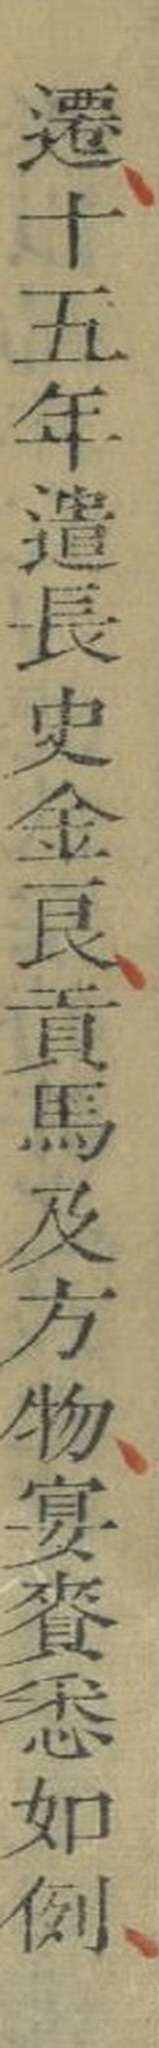遷十五年遣長史金良貢馬及方物宴賚悉如例
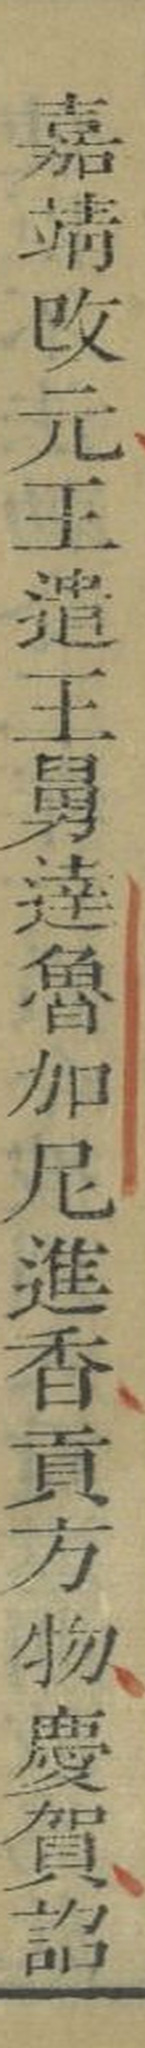嘉靖改元王遣王舅達魯加尼進香貢方物慶賀詔
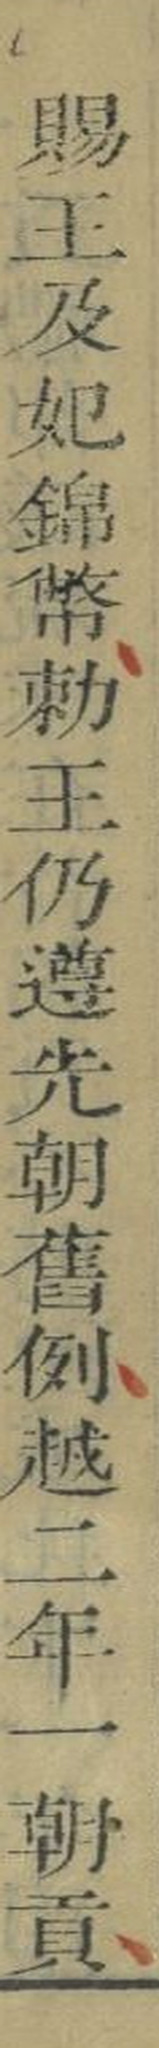賜王及妃錦幣勅王仍遵先朝旧例越二年一朝貢
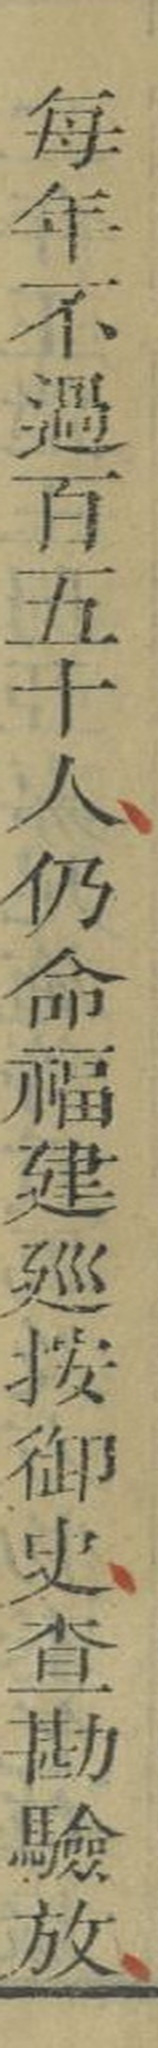毎年不過百五十人仍命福建巡按御史査勘験放
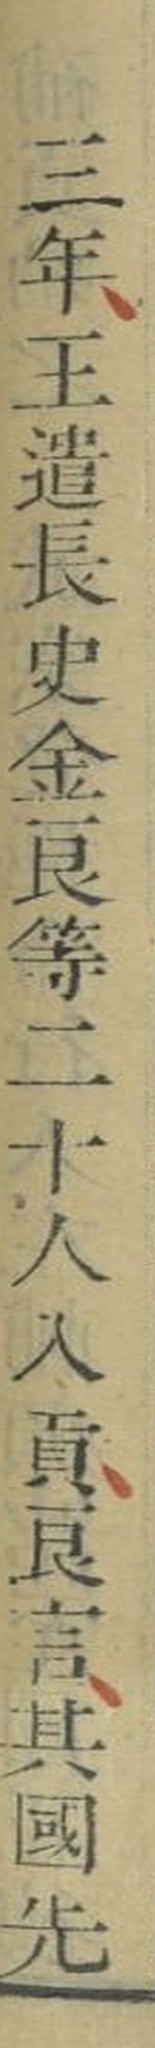三年王遣長史金良等二十人入貢良言其国先
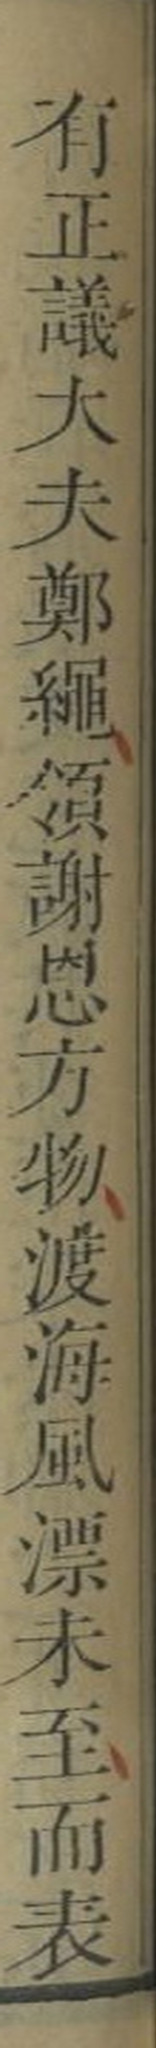有正議大夫鄭縄領謝恩方物渡海風漂未至而表
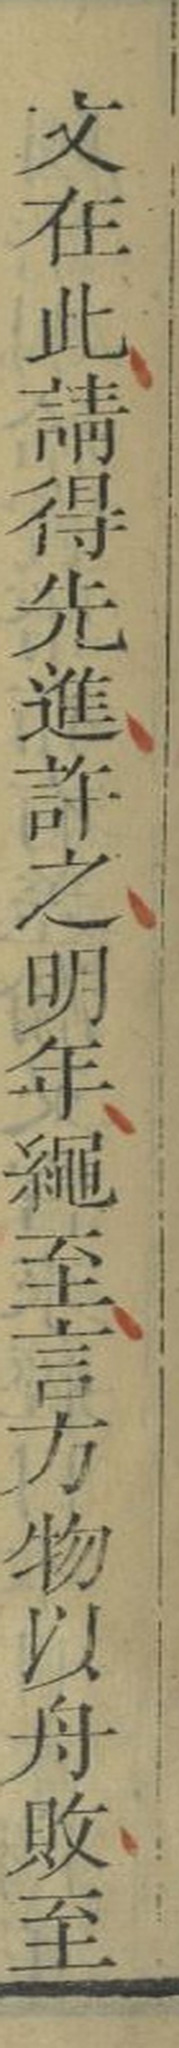文在此請得先進許之明年縄至言方物以舟敗至
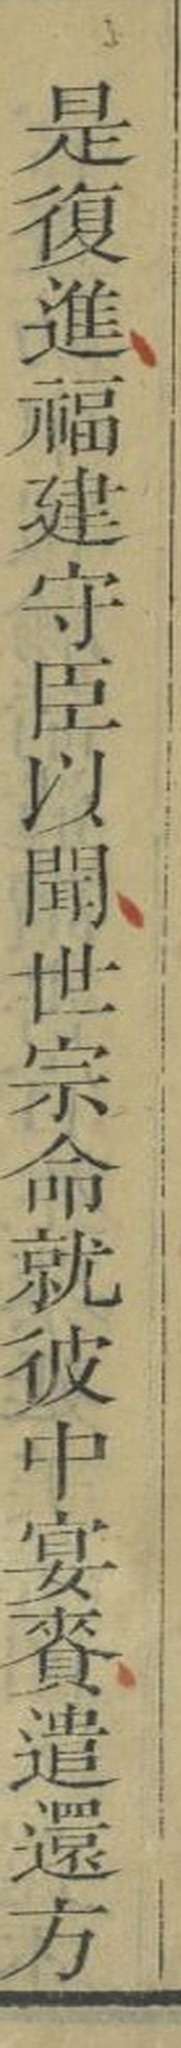是復進福建守臣以聞世宗命就彼中宴賚遣還方
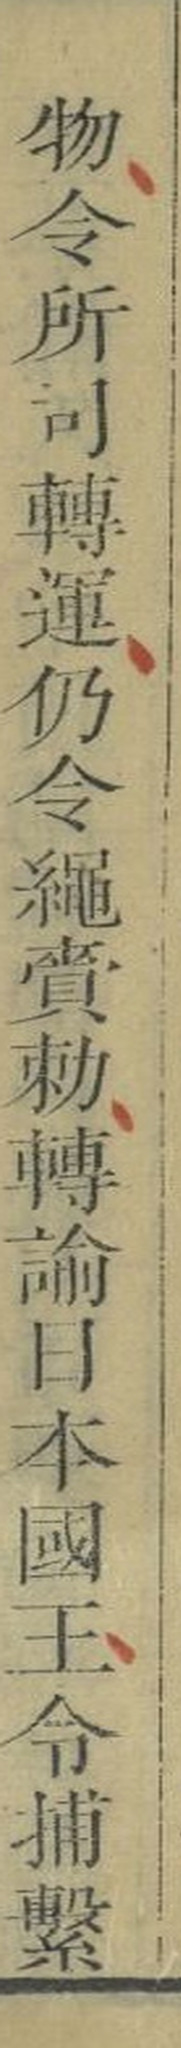物令所司転運仍令縄賚勅転諭日本国王令捕繋
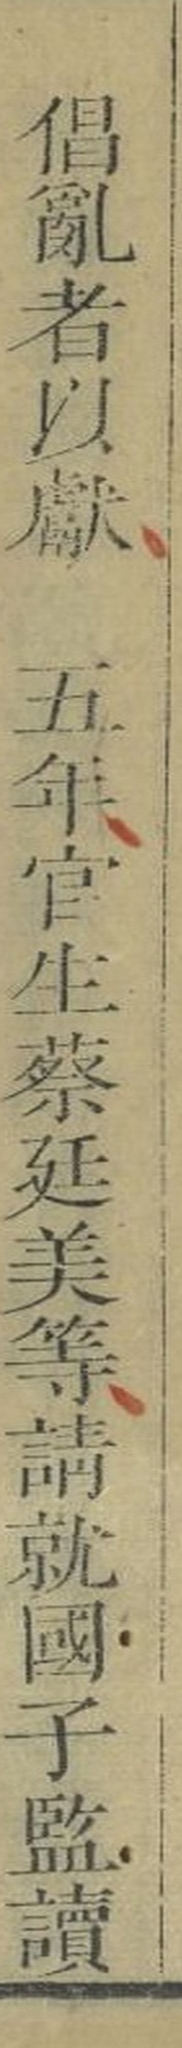倡乱者以献五年官生蔡廷美等請就国子監読
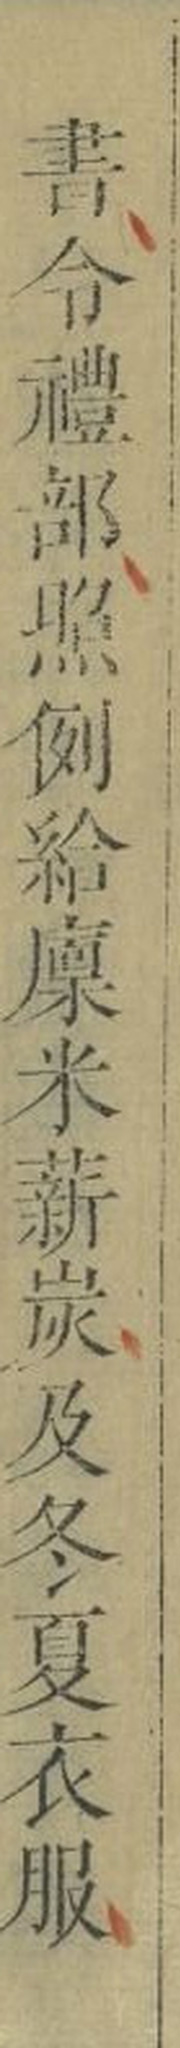書令礼部照例給廩米薪炭及冬夏衣服
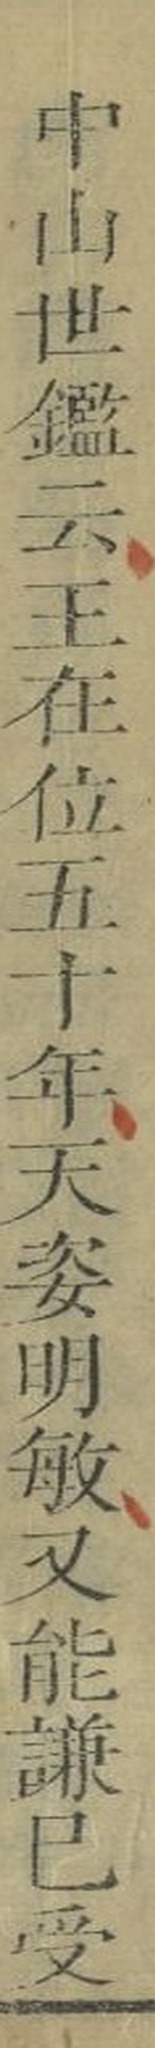中山世鑑云王在位五十年天姿明敏又能謙巳受
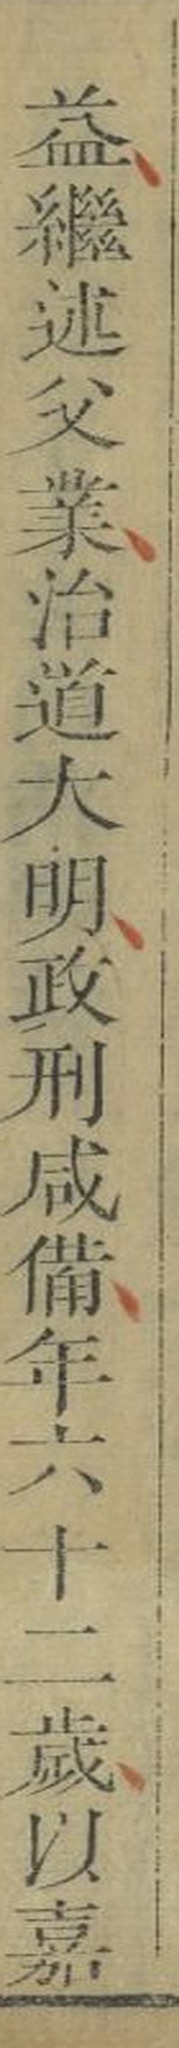益継述父業治道大明政刑咸備年六十二歳以嘉
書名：中山伝信録 巻三
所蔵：University of the Ryukyus Library
